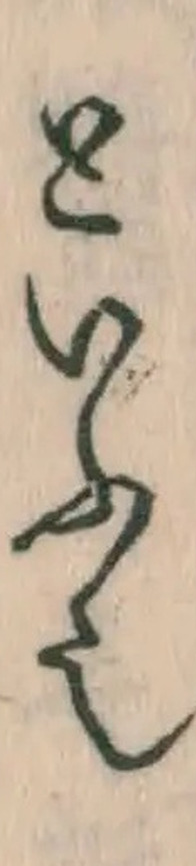といふ也
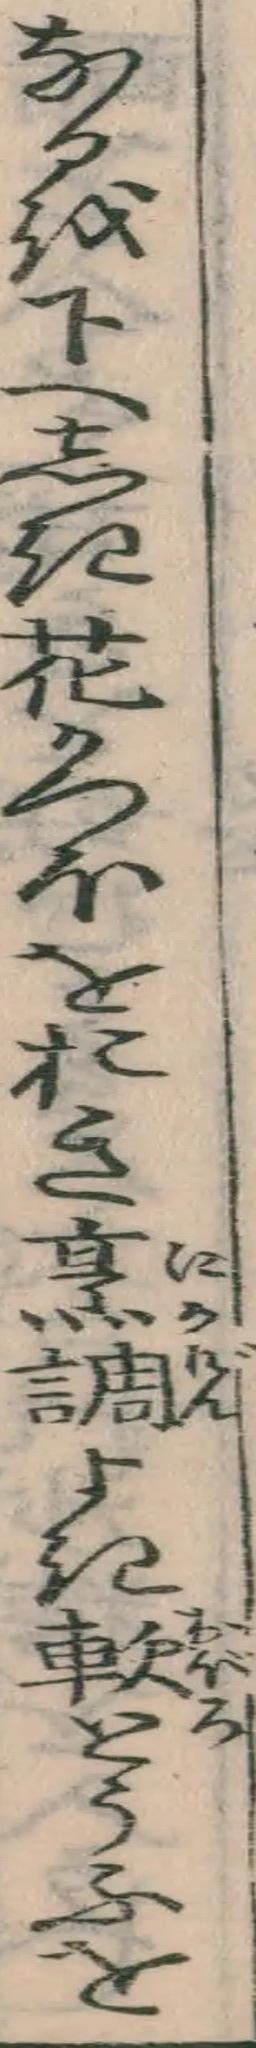なるを下へしき花かつほをおき烹調よき軟とうふを
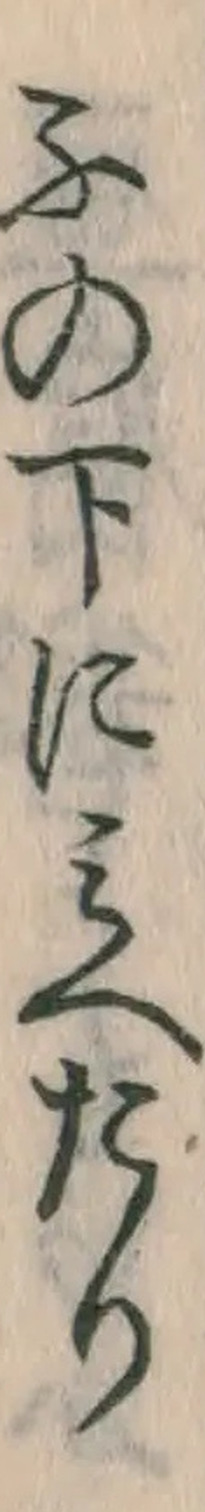ふの下にみへたり
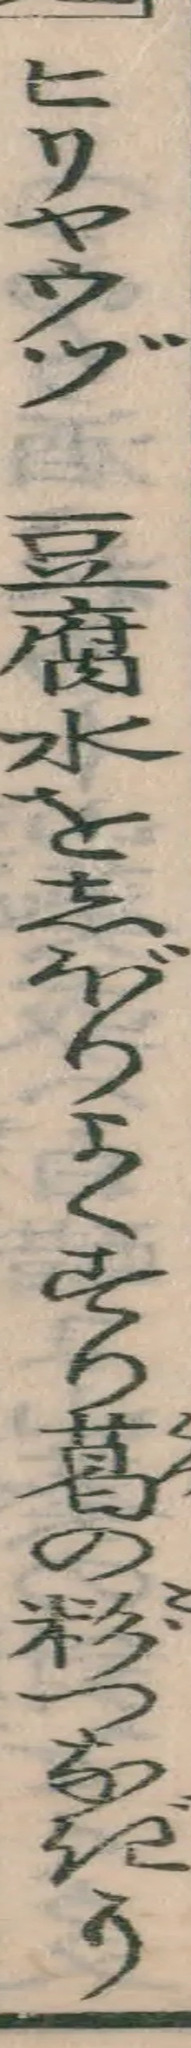[十九]ヒリヤウヅ豆腐水をしぼりよくすり葛の粉つなぎに
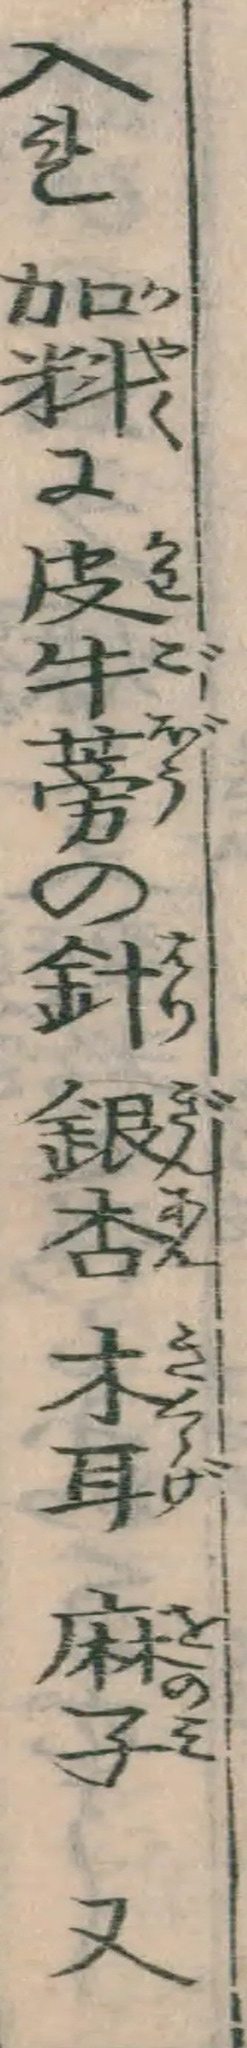入れ加料に皮牛蒡の針銀杏木耳麻子又
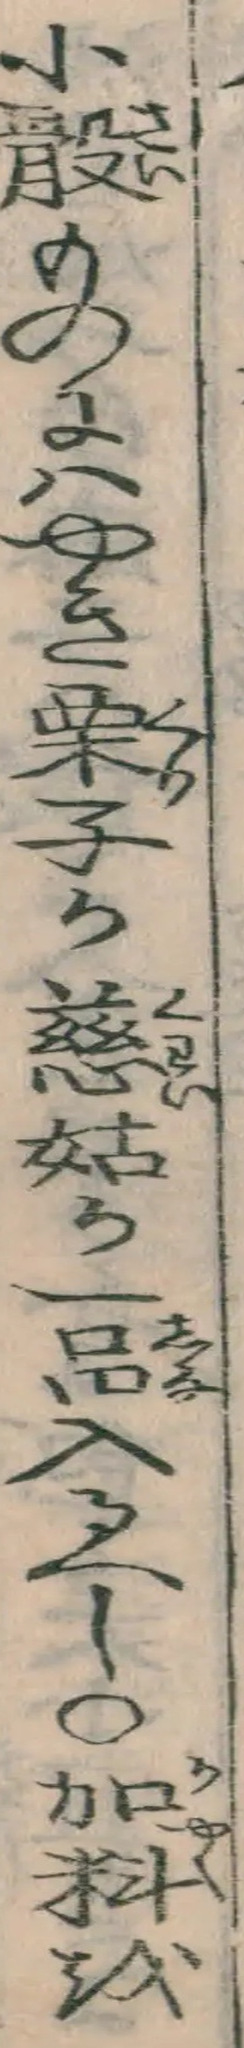小骰ものにはやき栗子か慈姑か一品入るへし○加料を

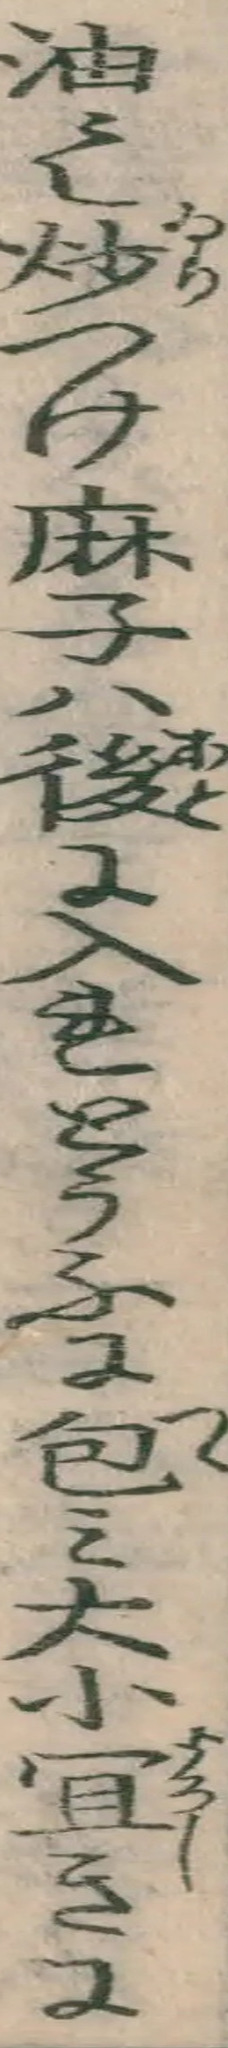油にて炒つけ麻子は後に入れとうふに包み大小冝きに
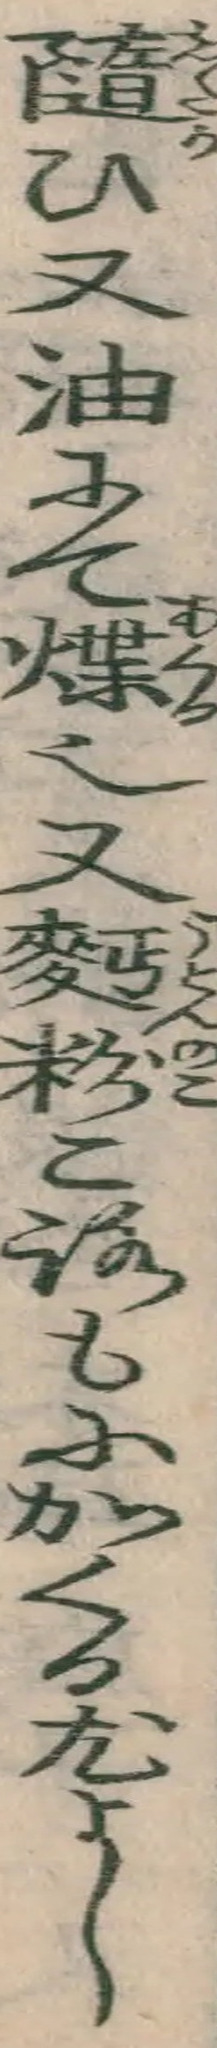隨ひ又油にて煠也又麪粉ころもにかくる尤よし
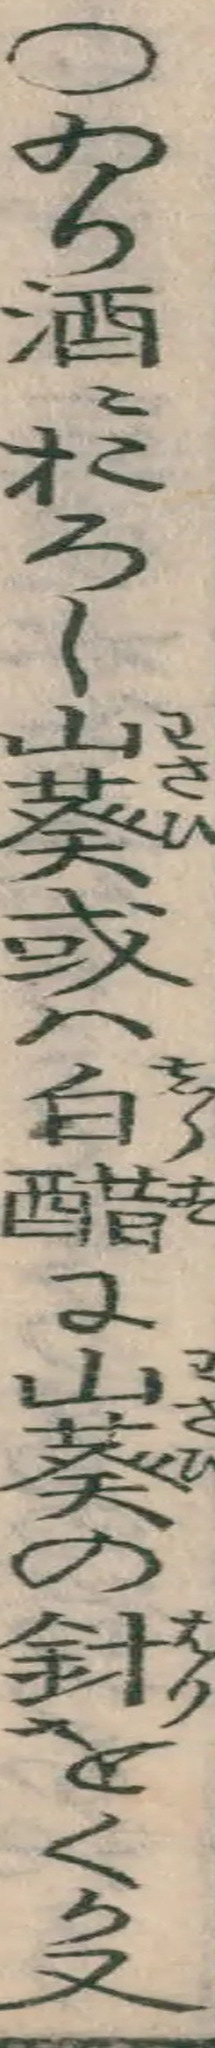○ゐり酒におろし山葵或は白醋に山葵の針をくか又
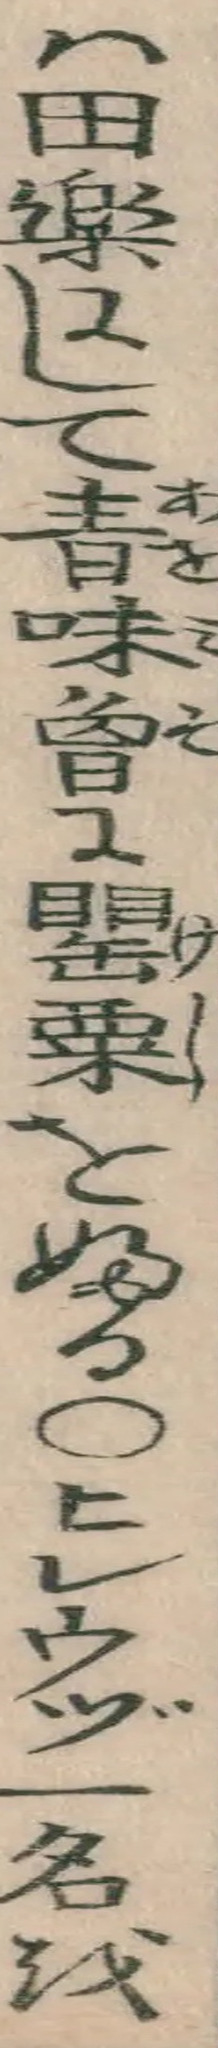は田楽にして青味曾に罌粟をふる○ヒレウヅ一名を
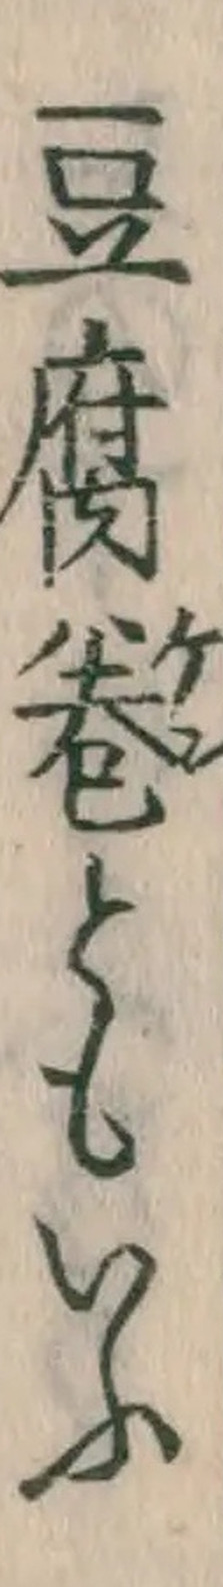豆腐巻ともいふ
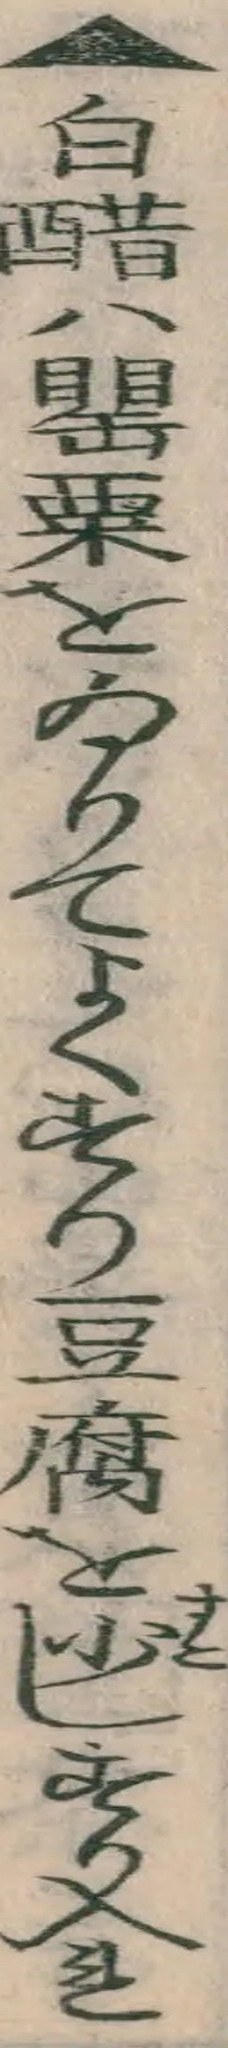▲白醋は罌粟をゐりてよくすり豆腐を少しすり入れ
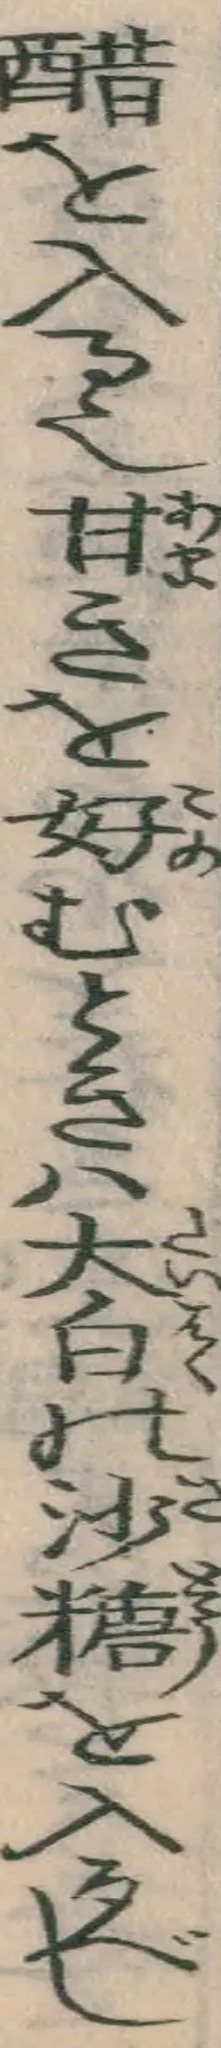醋を入る也甘きを好むときは大白の沙糖を入るべし
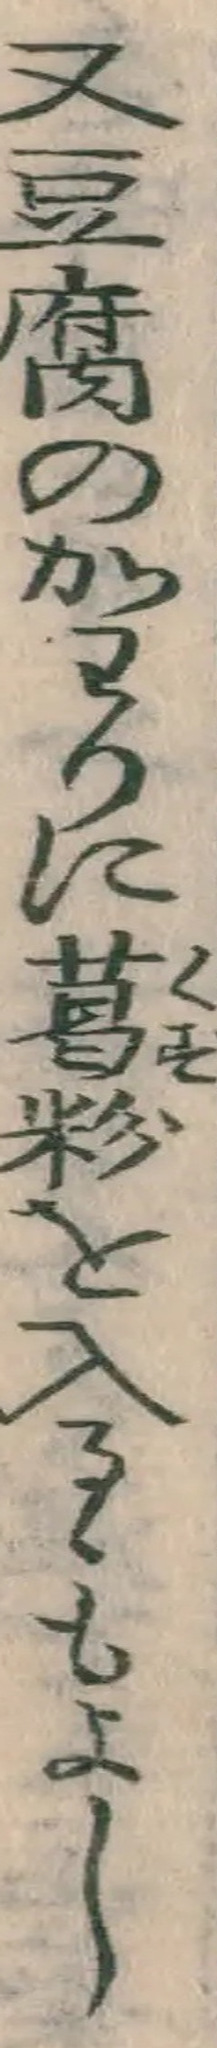又豆腐のかわりに葛粉を入るゝもよし
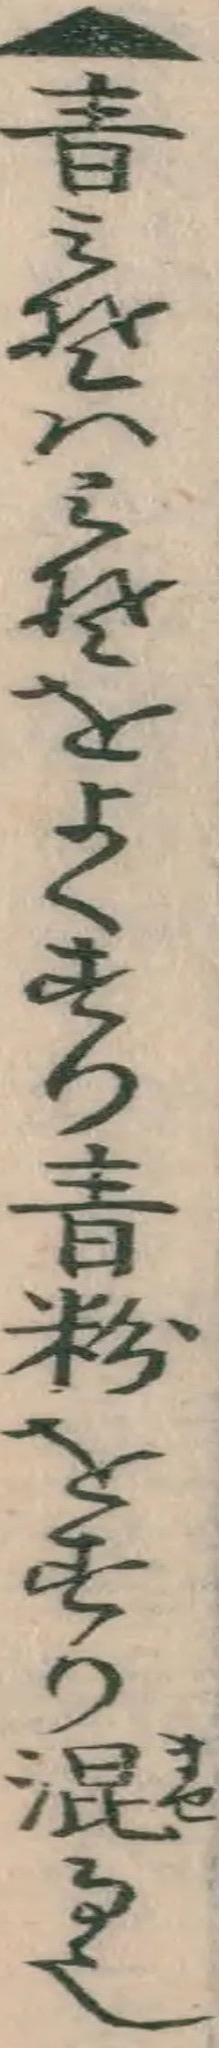▲青みそはみそをよくすり青粉をすり混る也
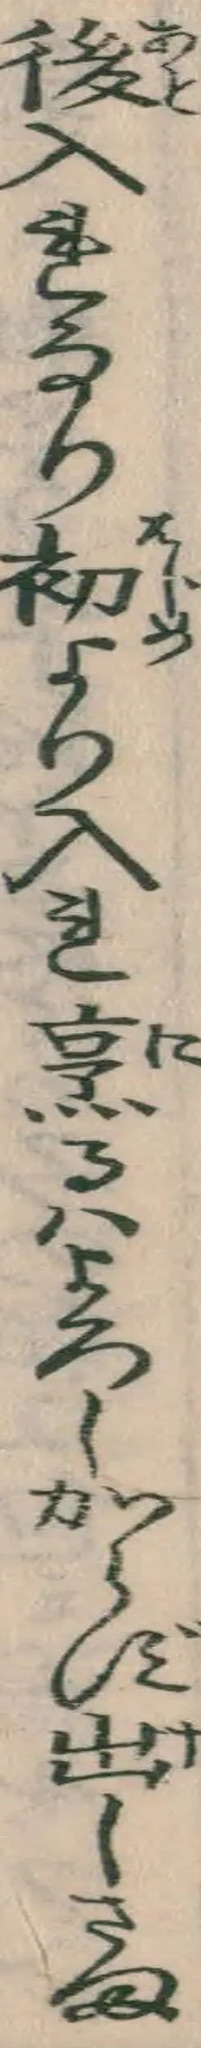後入れなり初より入れ烹るはよろしからず出しさま
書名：豆腐百珍. [正編]
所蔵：国立国会図書館 National Diet Library, JAPAN
